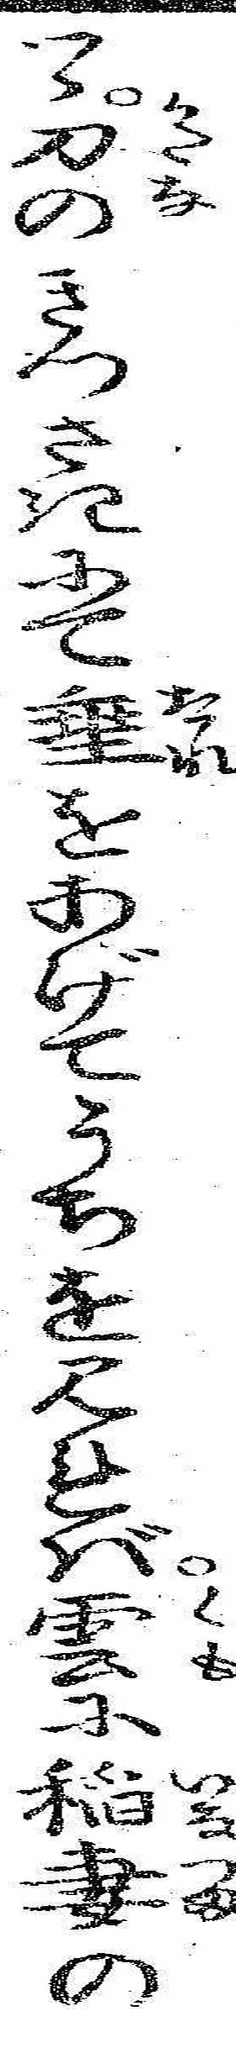つゝ。刀のきつさきにて垂をあげてうちを見れば。雲に稲妻の
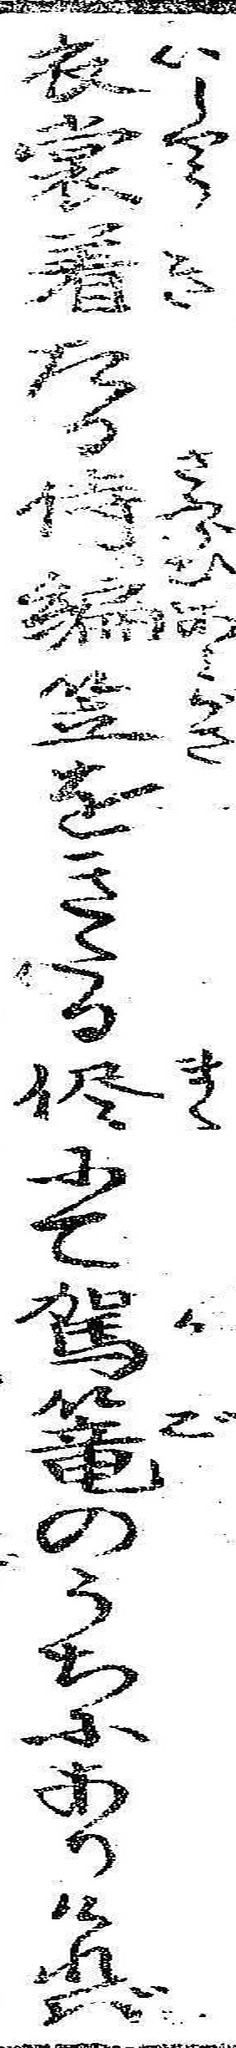衣裳着たる侍。編笠をきたる侭にて駕篭のうちにありければ。
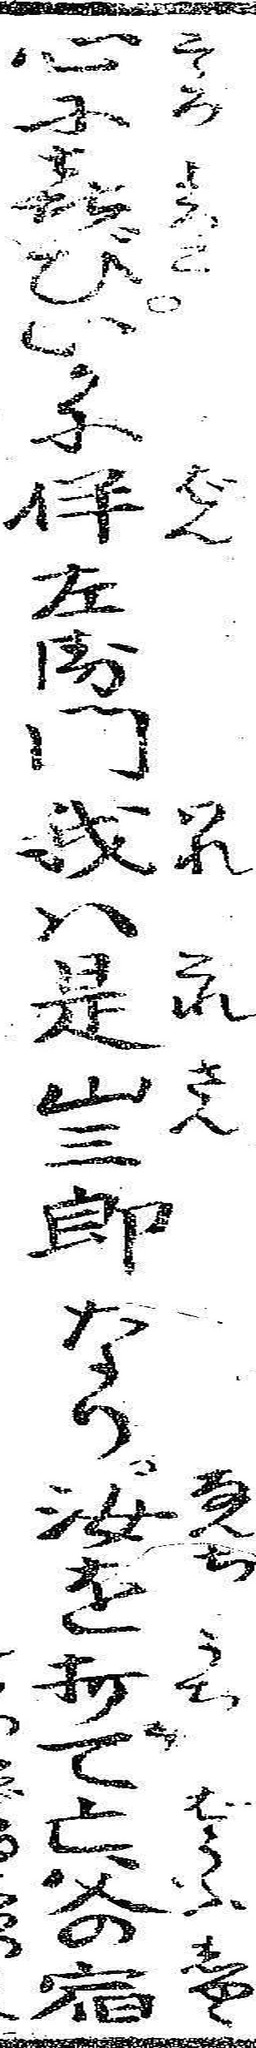心に喜び。いかに伴左衛門我は是山三郎なり。汝を打て亡父の宿
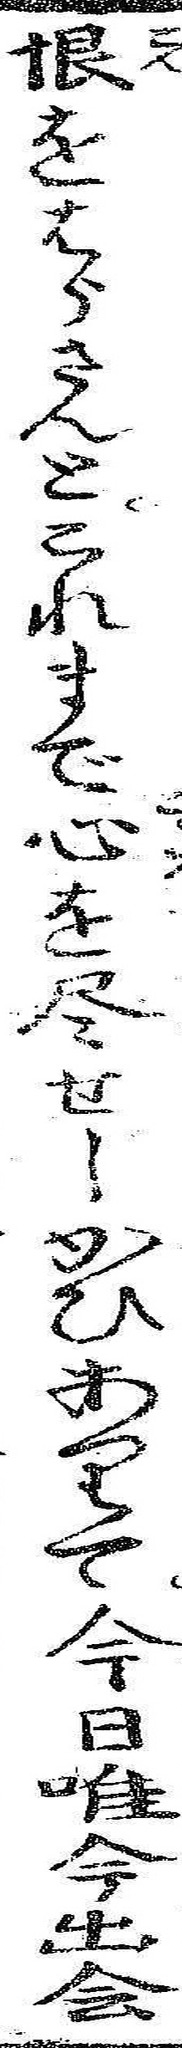恨をはらさんと。これまで心を尽せしかひありて。今日唯今出会
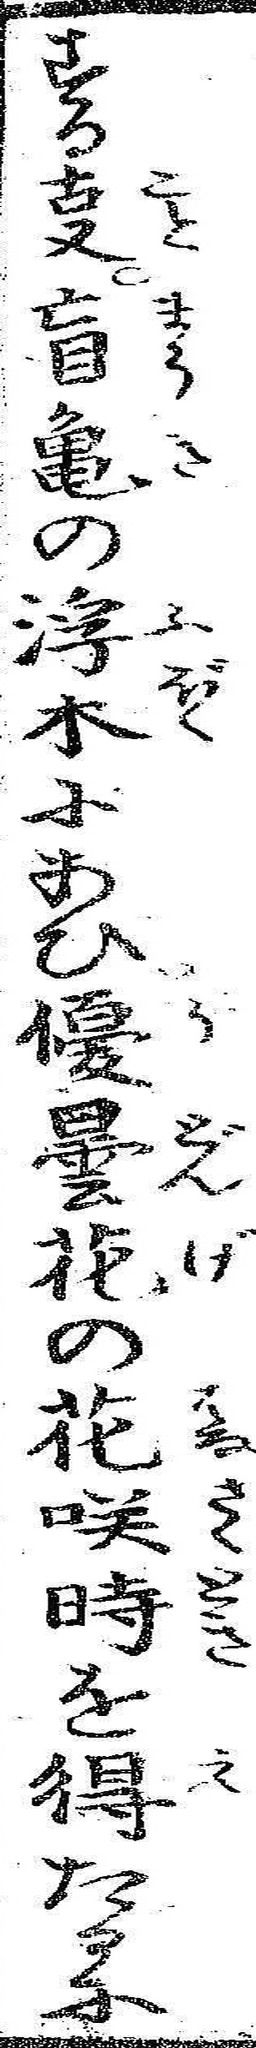する事。盲亀の浮木にあひ。優曇花の花咲時を得たるに
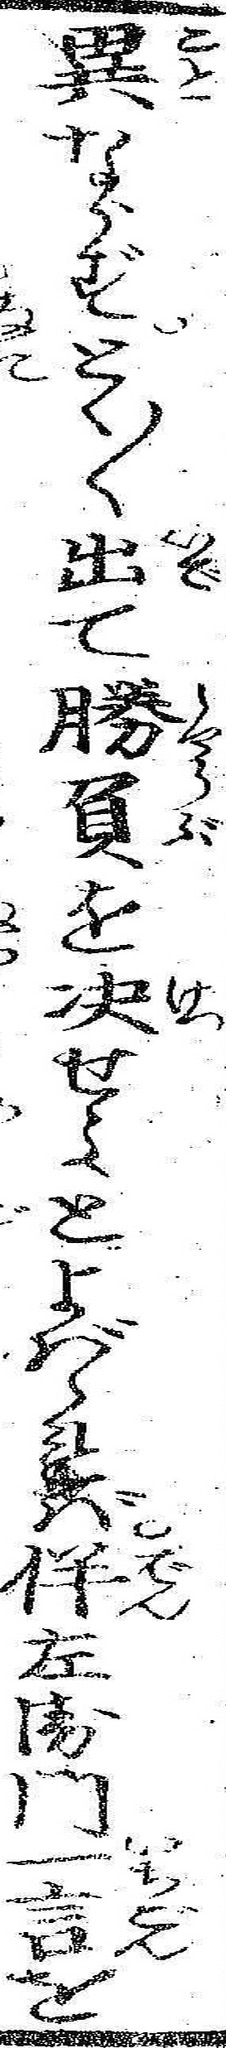異ならず。とく〳〵出て勝負を決せよとよばゝれば。伴左衛門一言を
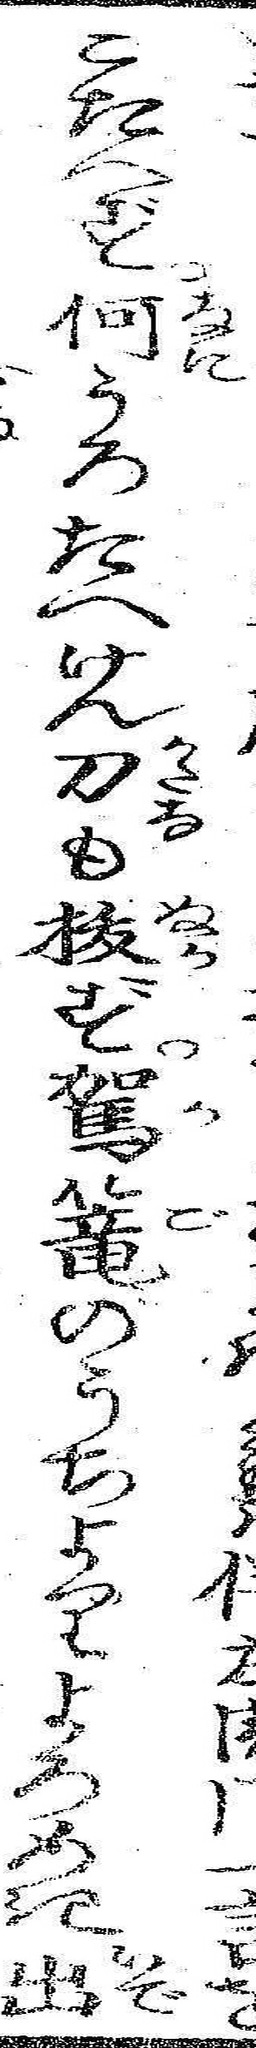こたへず。何うろたへけん刀も抜ず。駕篭のうちよりよろめき出
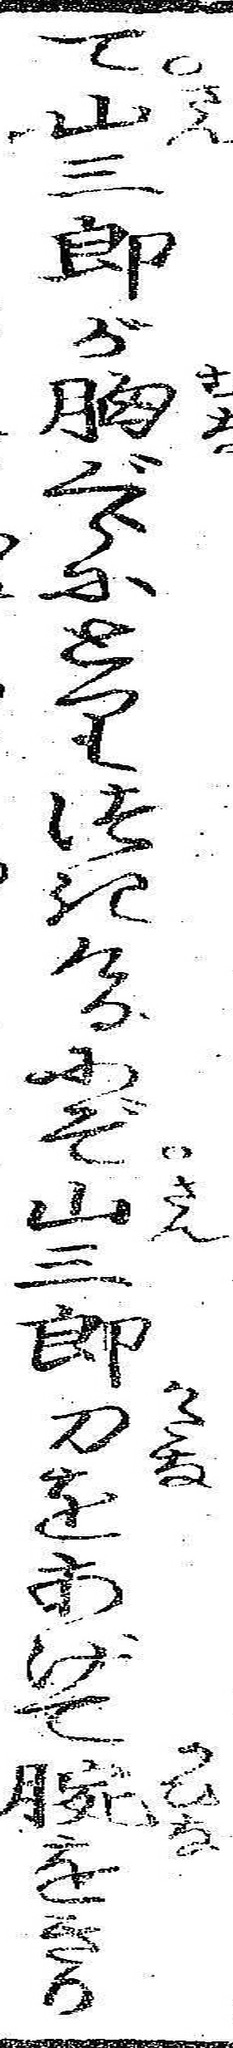て。山三郎が胸ぐらにとりつきけるにぞ。山三郎刀をあげて腕をきり
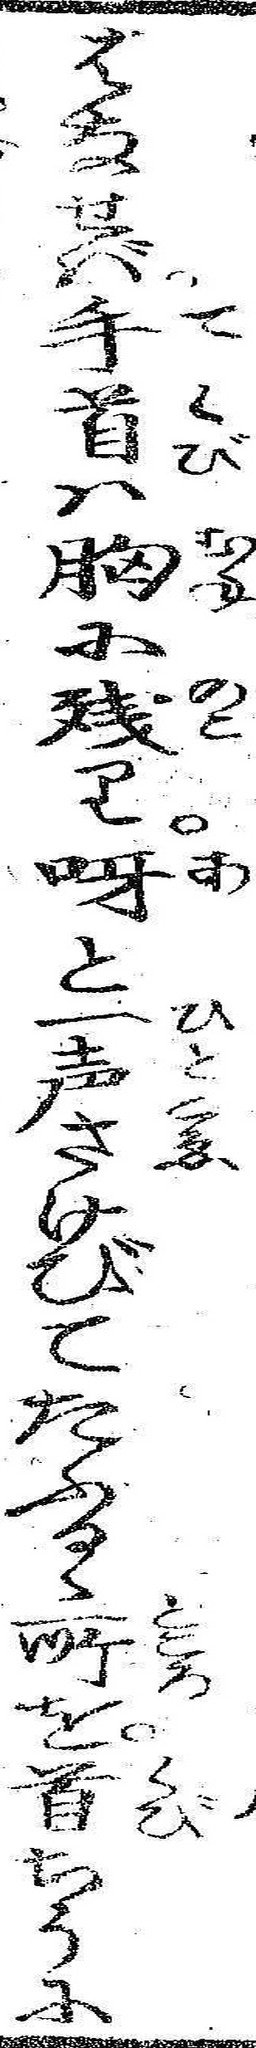はなせば。手首は胸に残り。呀と一声さけびてたふるゝ所を。首ちうに
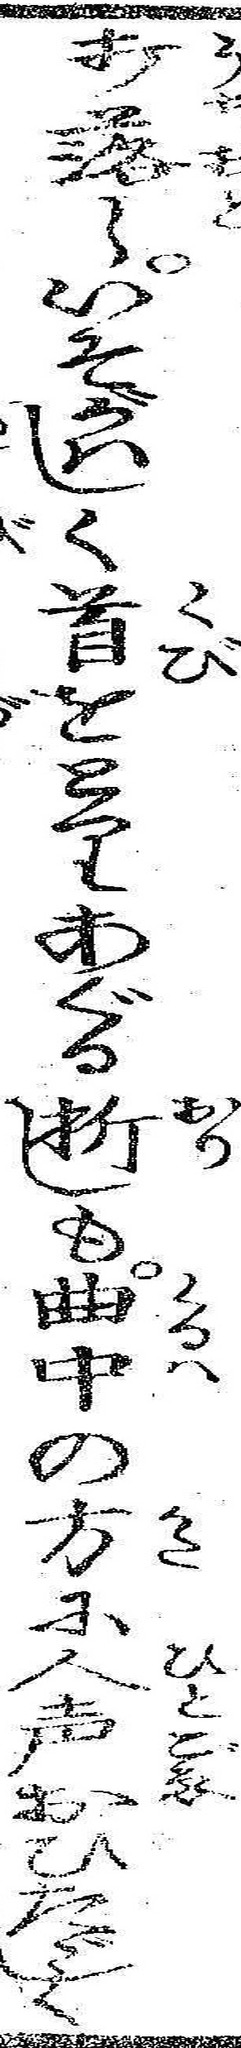打落し。いそがはしく首をとりあぐる折しも。曲中の方に人声おひたゞしく
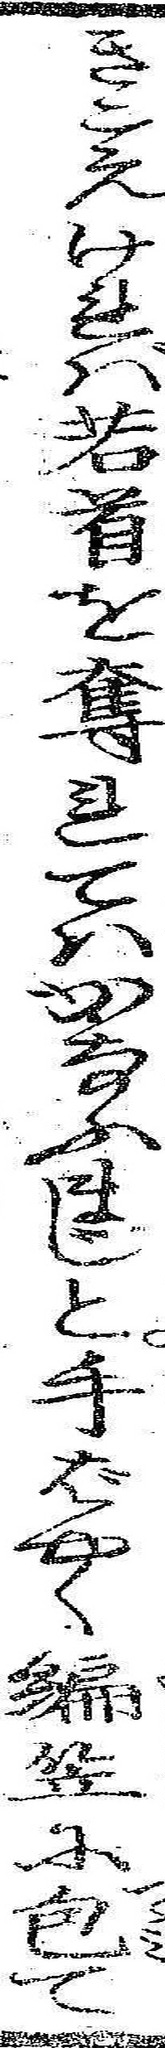きこえければ。若首を奪れてはかなふまじと。手ばやく編笠に包て
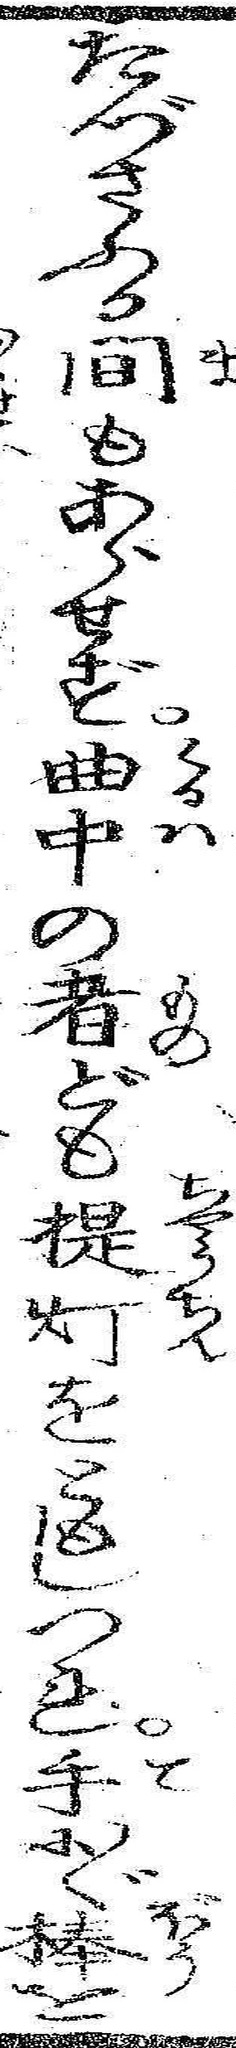たづさふる間もあらせず。曲中の者ども提灯をともしつれ。手に〴〵棒を
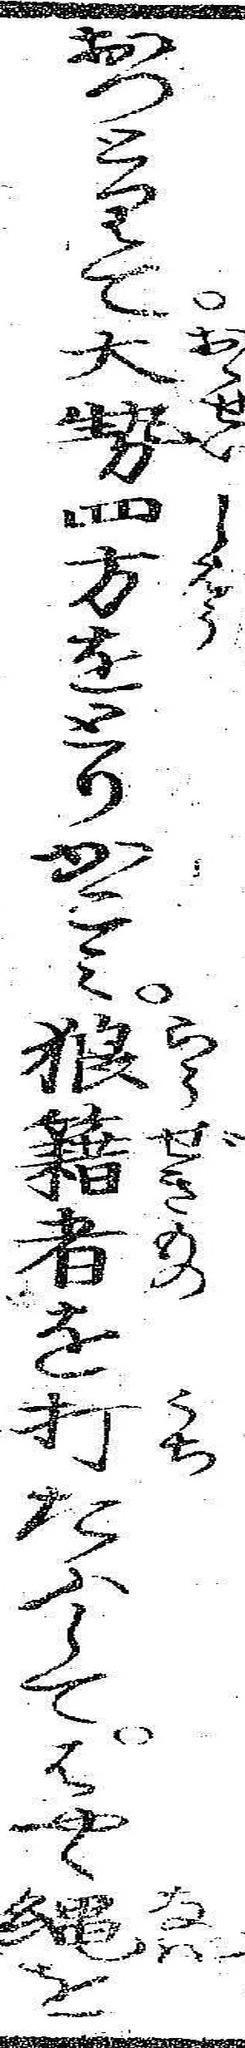おつとりて。大勢四方をとりかこみ。狼籍者を打たふして。はやく縄を
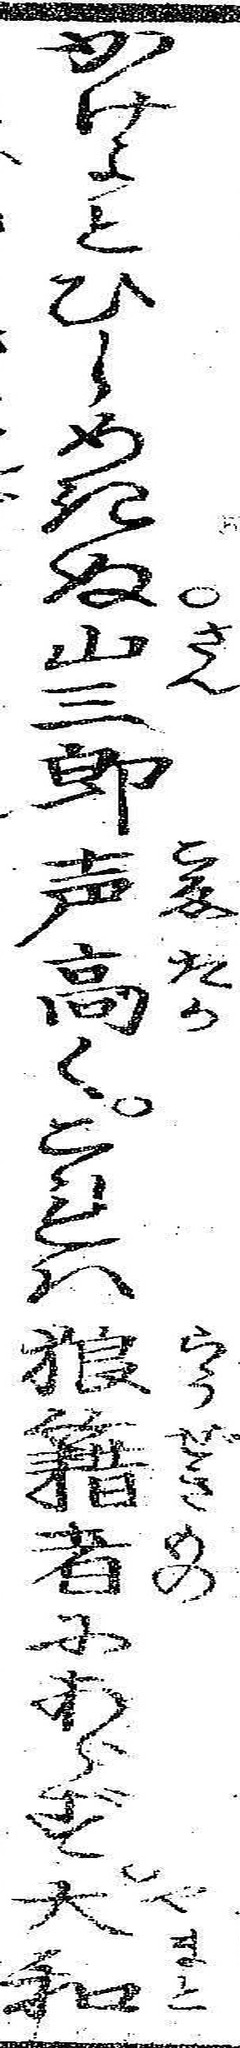かけよとひしめきぬ。山三郎声高く。これは狼籍者にあらず。大和
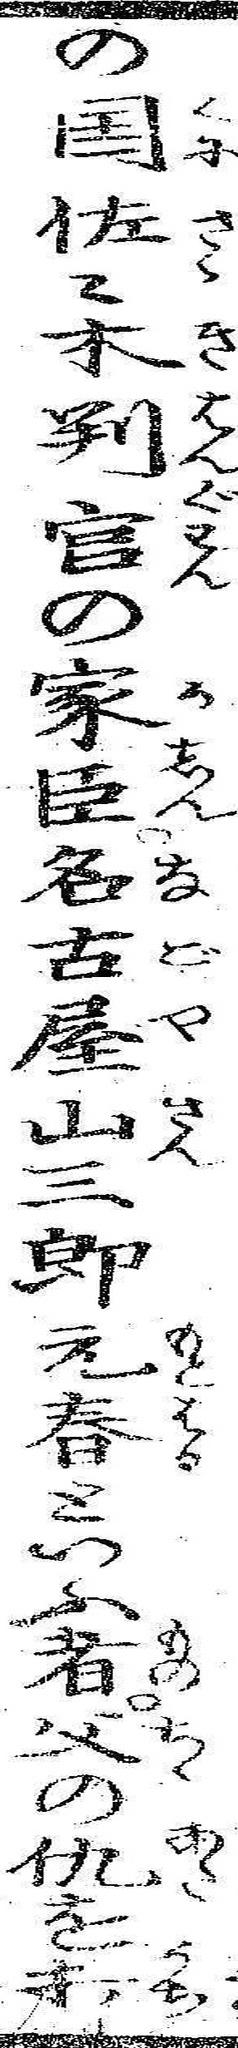の国佐々木判官の家臣。名古屋山三郎元春といふ者。父の仇を打
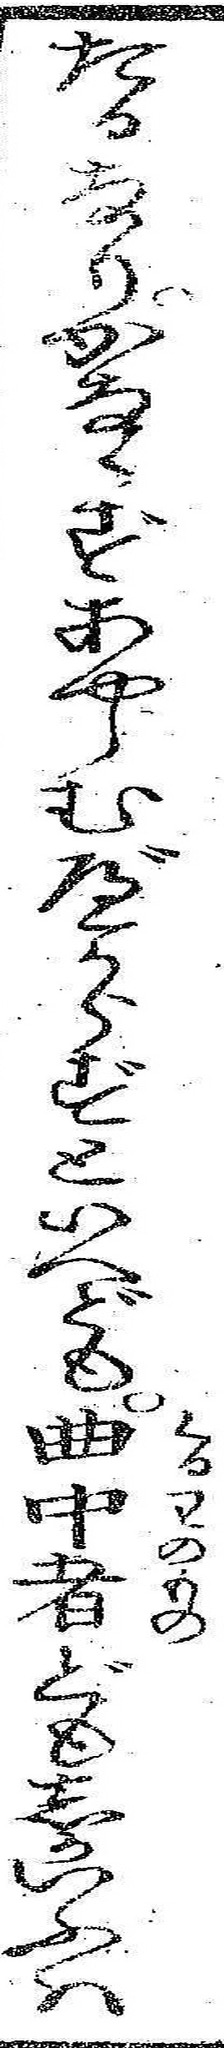たるなり。かならずあやしむべからずといへども。曲中者どもしかいふは
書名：昔話稲妻表紙
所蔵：国文学研究資料館
